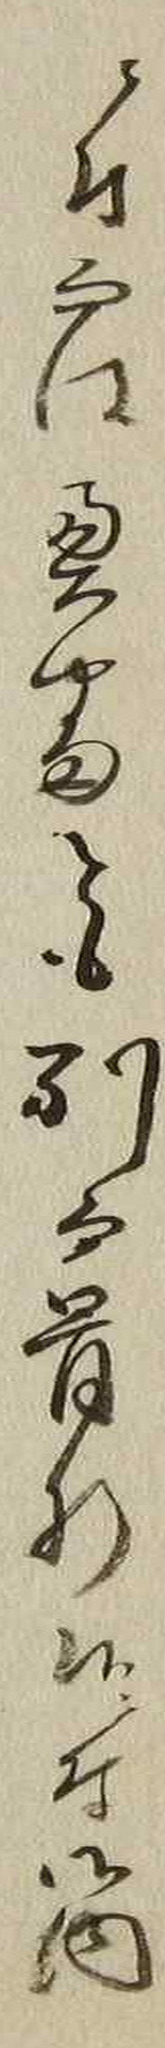ニ付而は奥番とも別而骨折候ニ付御内
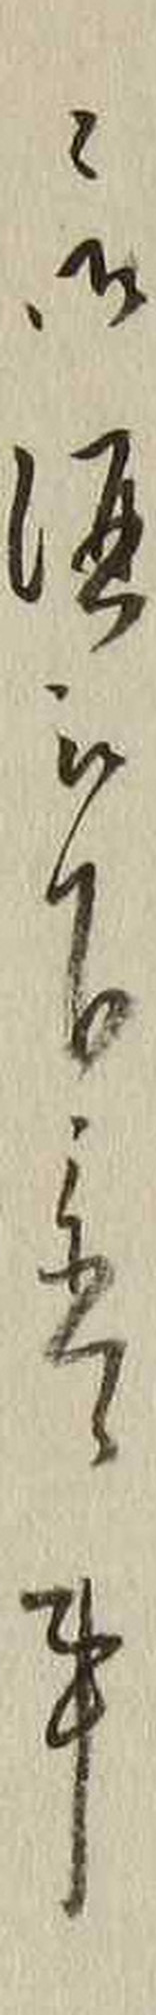々御酒被下置候事
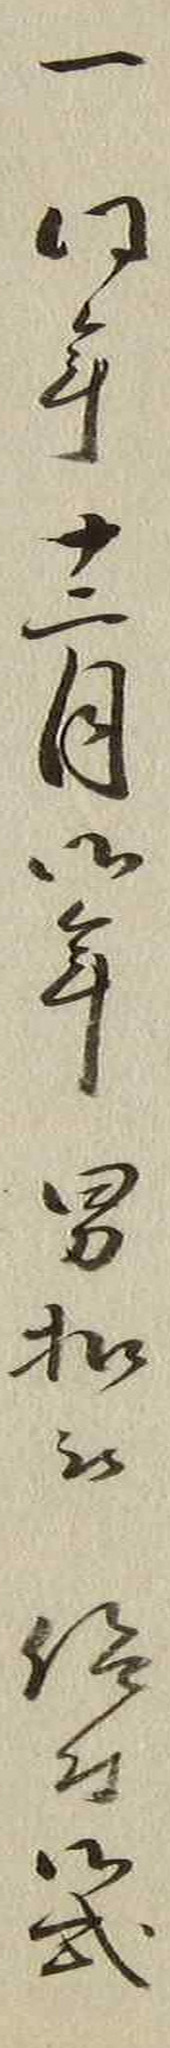一同年十二月御年男掛被仰付御式
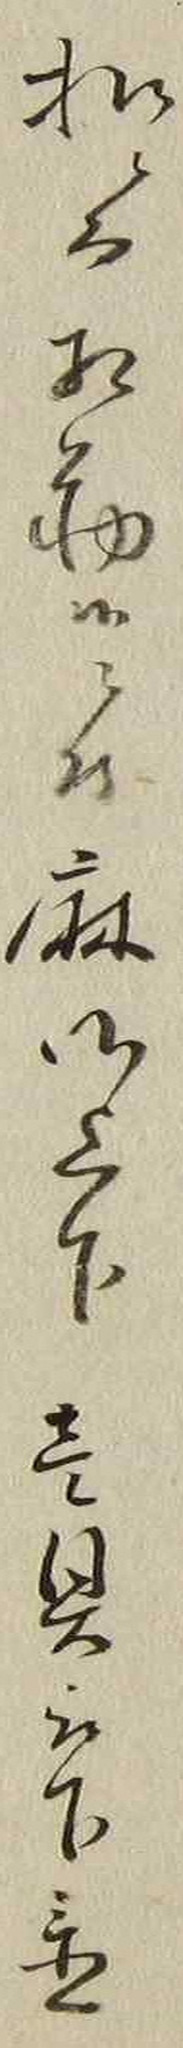掛ニ而相勤候ニ付麻御上下壱具被下置
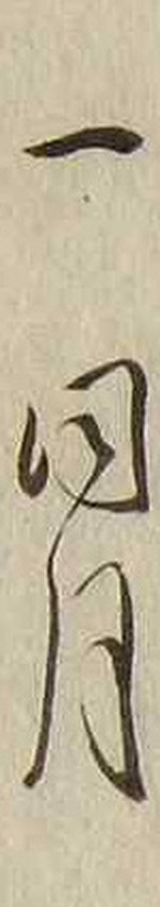一同月
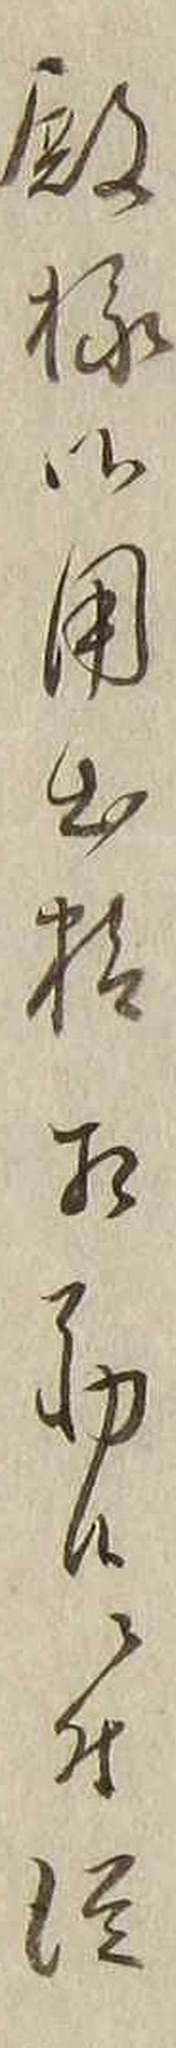殿様御用出精相勤候ニ付従

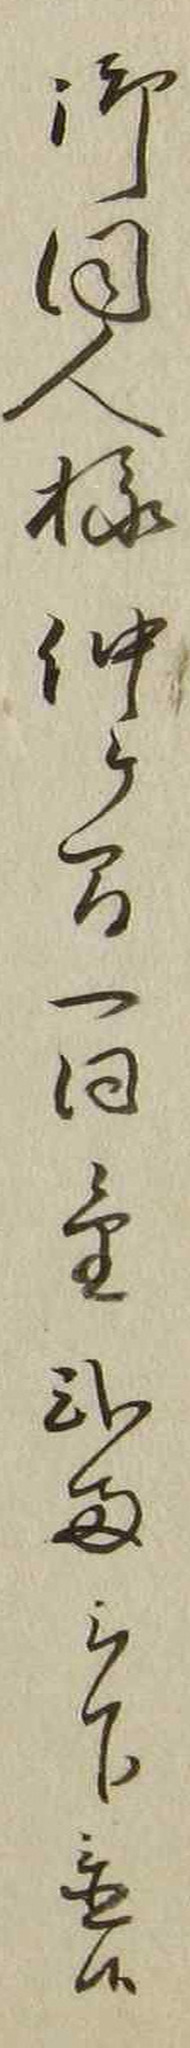御同人様仲ケ間一同金弐両被下置候
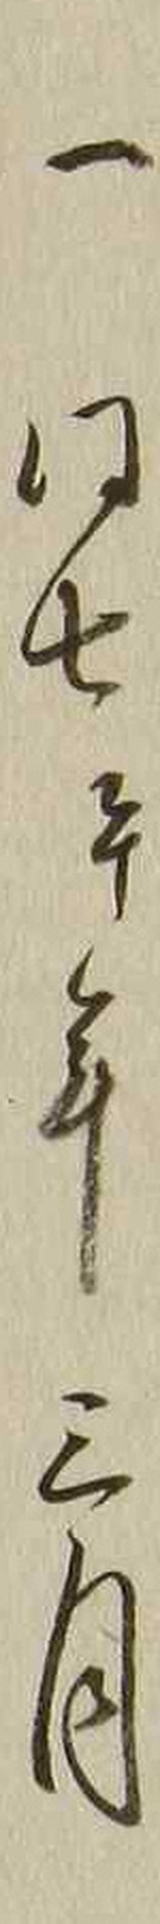一同七午年三月
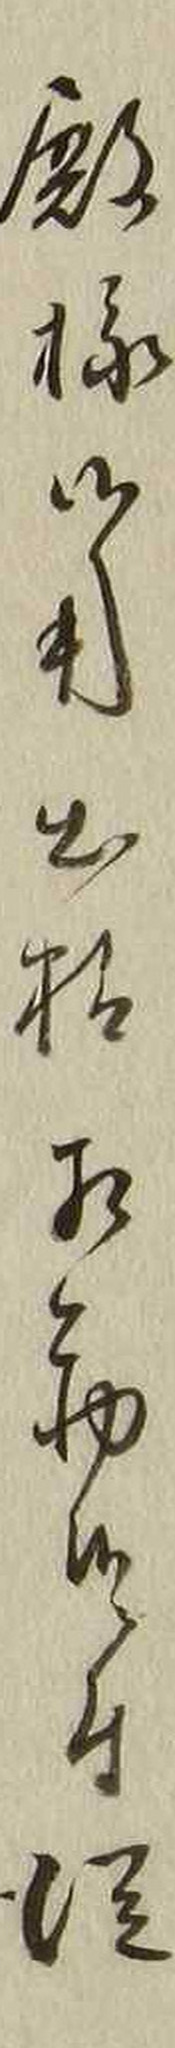殿様御用出精相勤候ニ付従
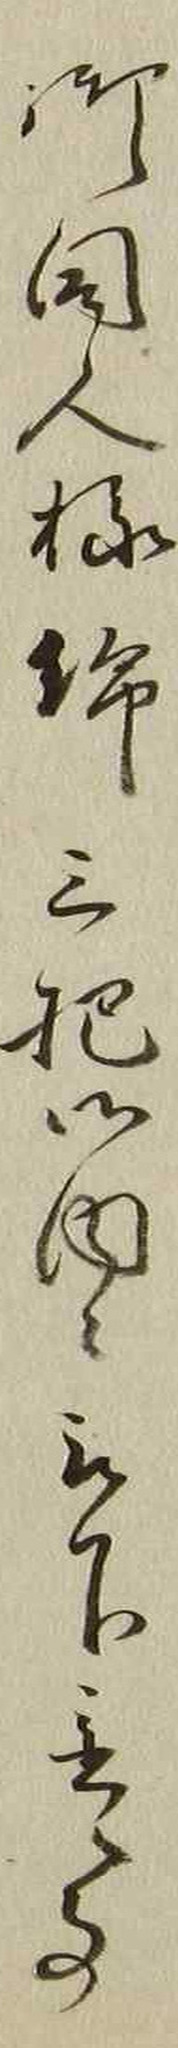御同人様綿三把御内々被下置候事
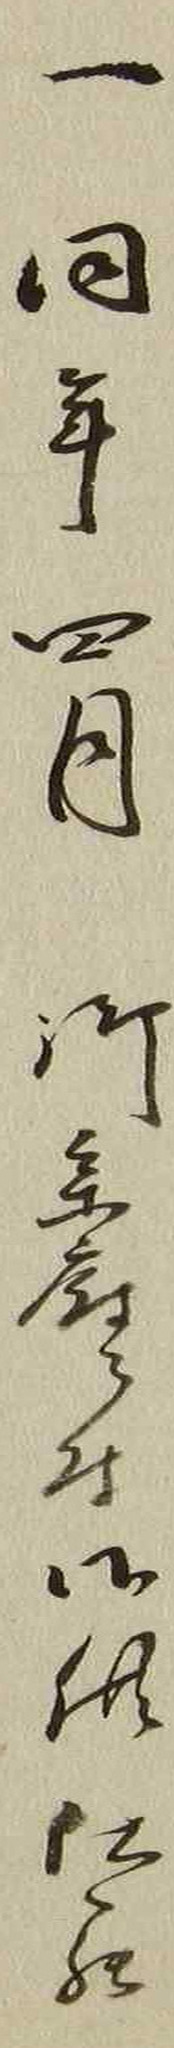一同年四月御参府ニ付御供仕罷
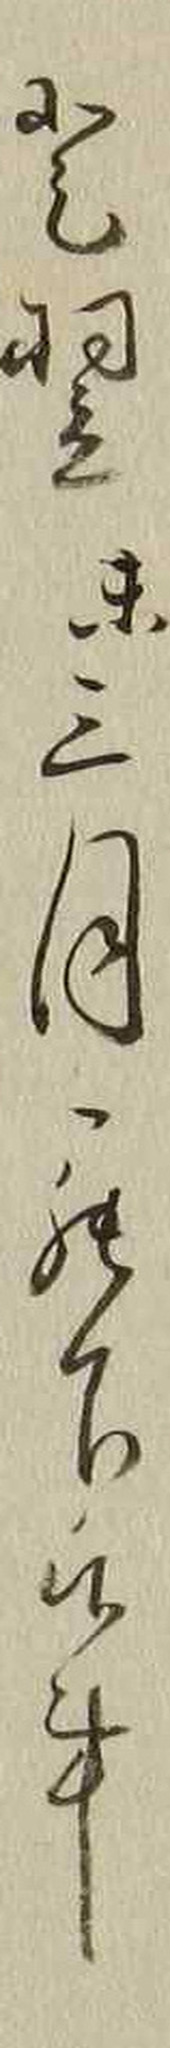登翌未三月罷下候事
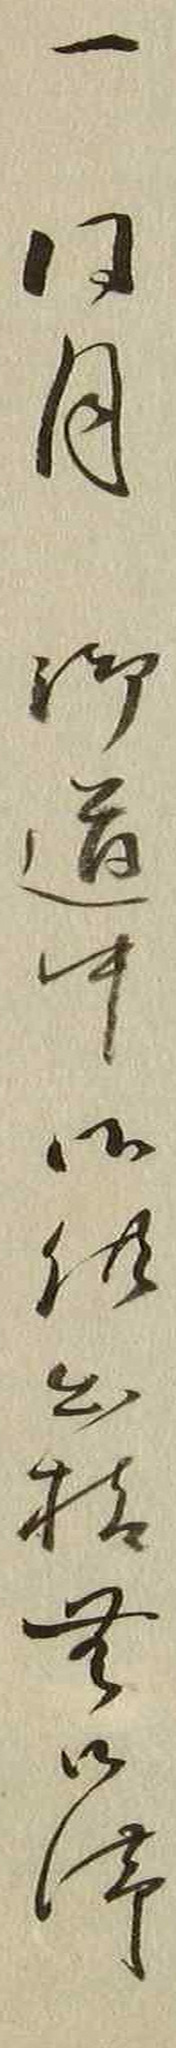一同月御道中御供出精無御滞
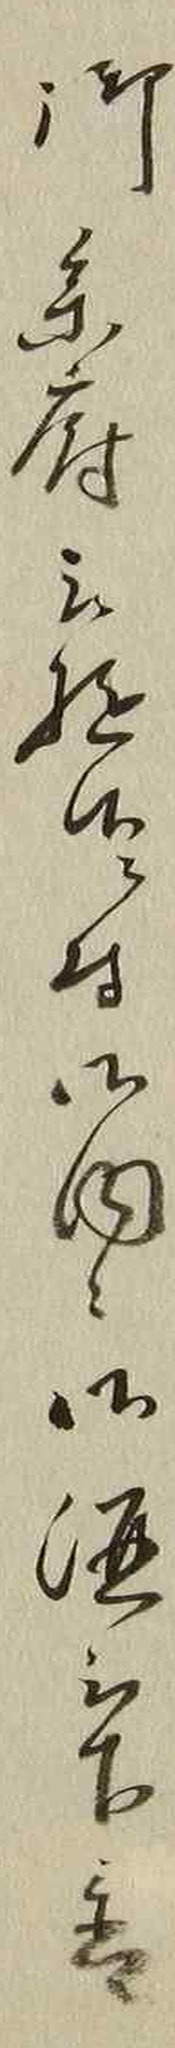御参府被遊候ニ付御内々御酒被下置候
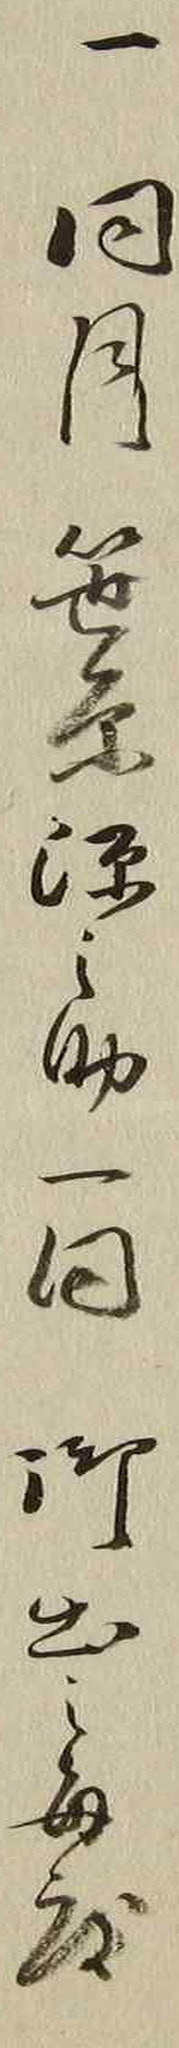一同月笹原源之助一同御出之毎度
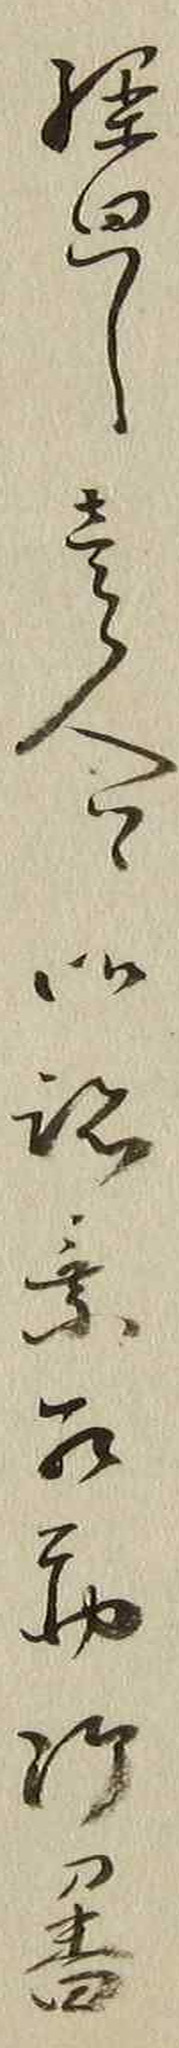繰廻し壱人ツヽ御跡乗相勤御刀番
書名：諸士系譜　巻之25　い之部25
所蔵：会津若松市立会津図書館
